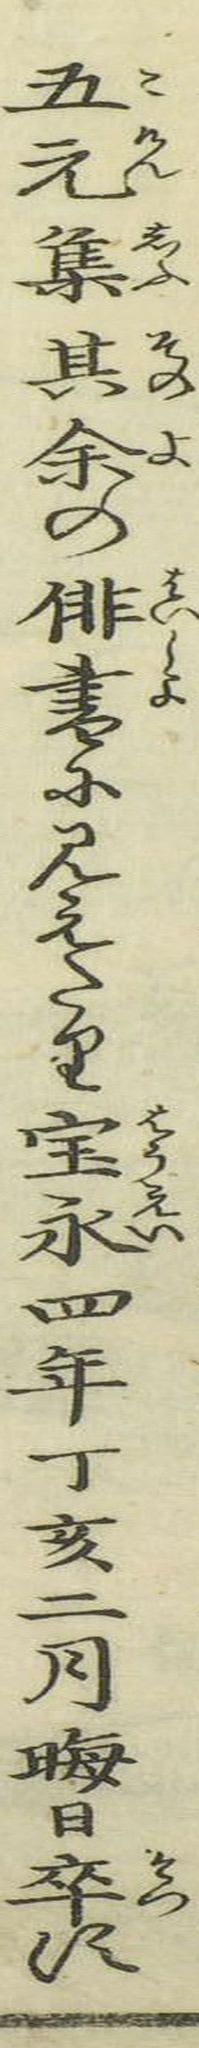五元集其余の俳書に見えたり宝永四年丁亥二月晦日卒す
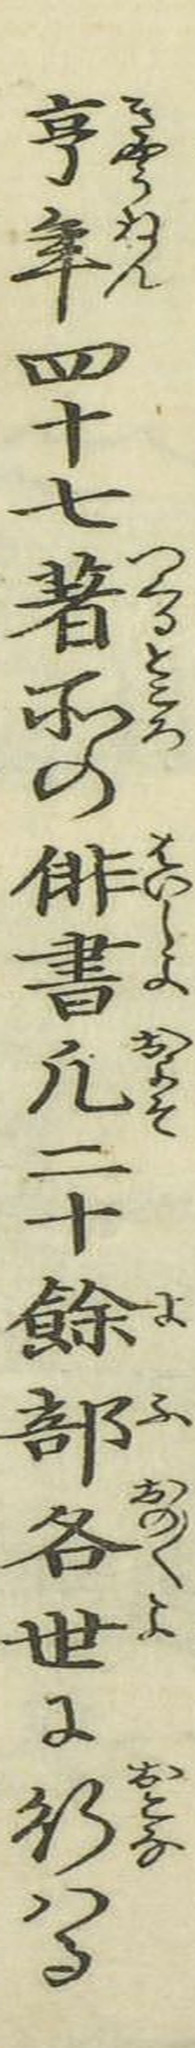享年四十七著所の俳書凡二十餘部各世に行はる
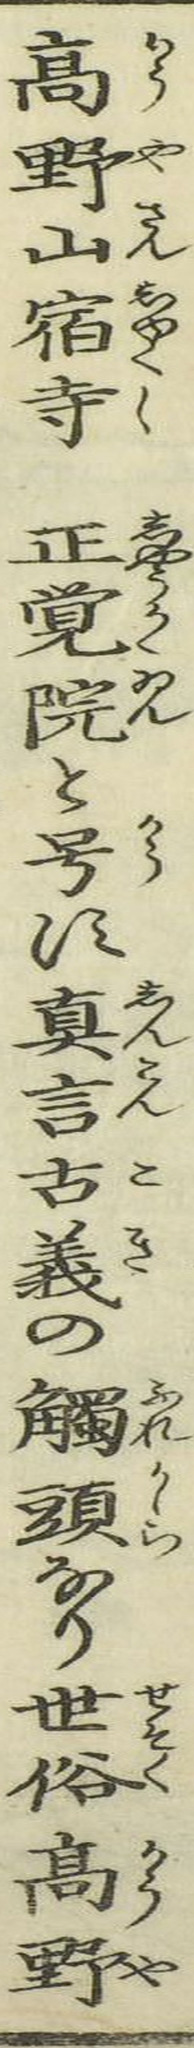髙野山宿寺正覚院と号す真言古義の觸頭なり世俗髙野
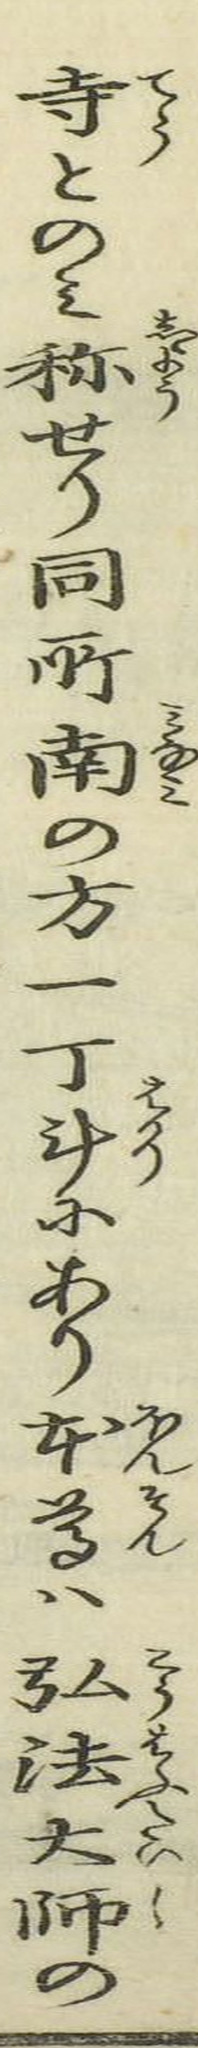寺とのみ称せり同所南の方一丁斗にあり本尊は弘法大師の
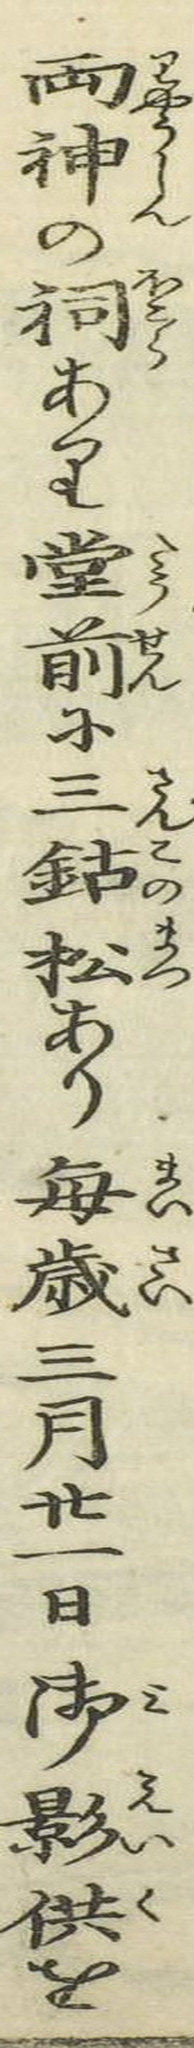両神の祠あり堂前に三鈷松あり毎歳三月廿一日御影供を
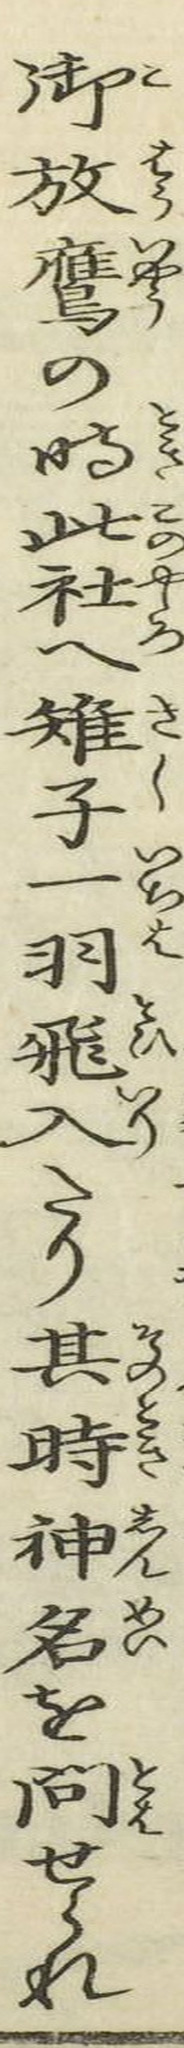御放鷹の時此社へ雉子一羽飛入たり其時神名を問せられ
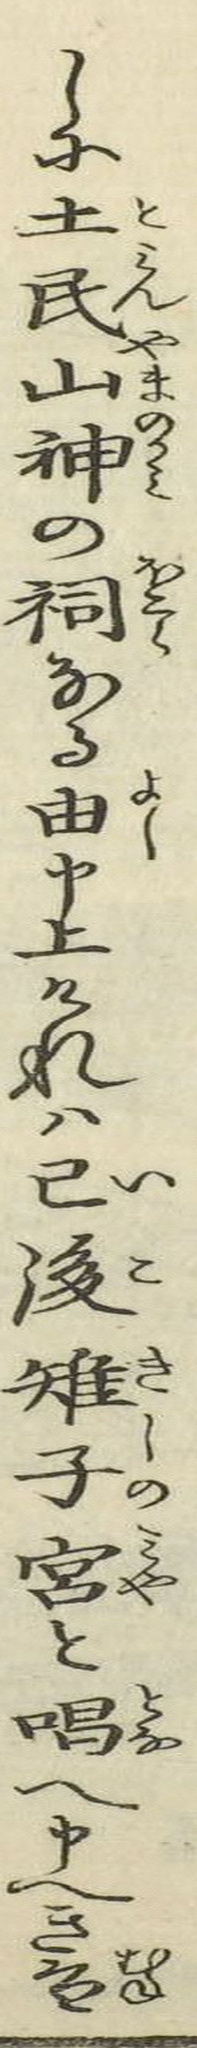しに土民山神の祠なる由申上けれは已後雉子宮と唱へ申へき旨
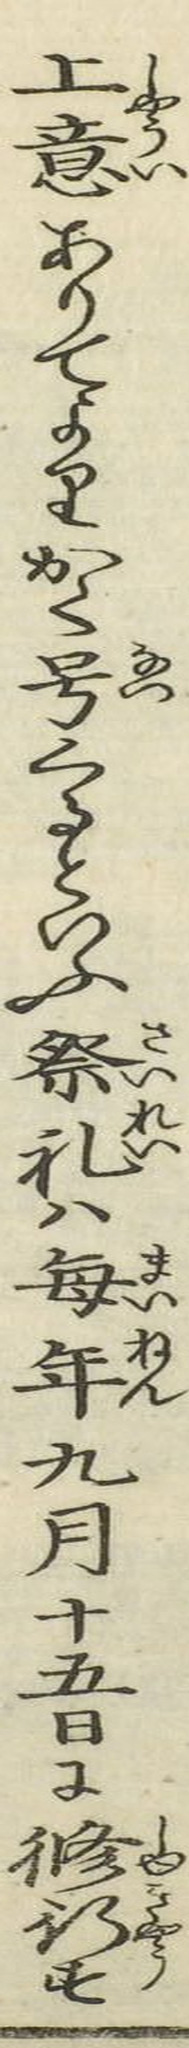上意ありてよりかく号くるといふ祭礼は毎年九月十五日に修行す
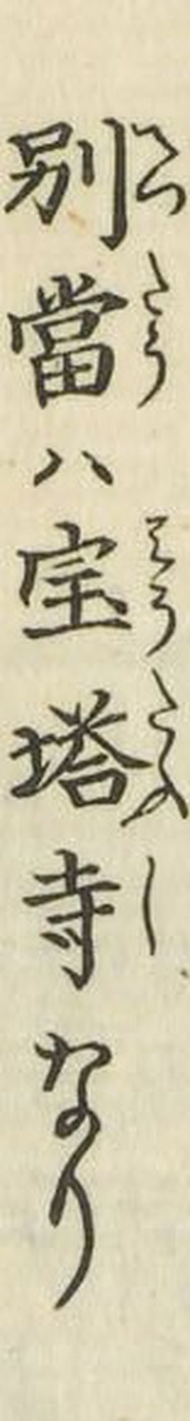別當は宝塔寺なり
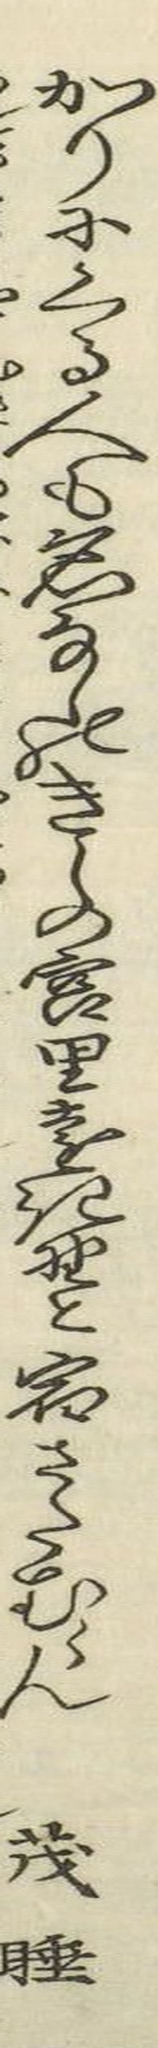かりにくる人も名なしのきしの宮里遠き野と宿さたむらん茂睡
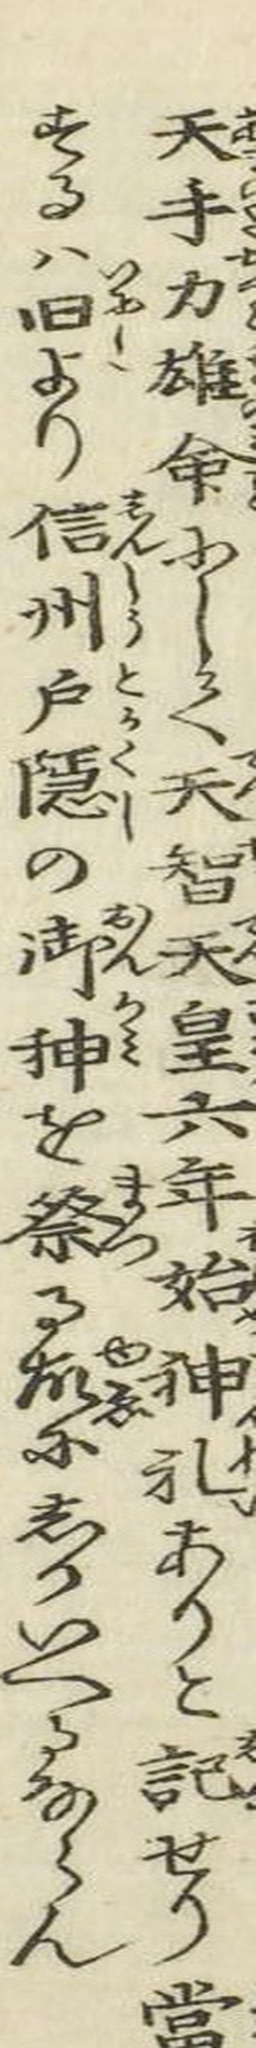するは旧より信州戸隠の御神を祭る故にしかいへるならん
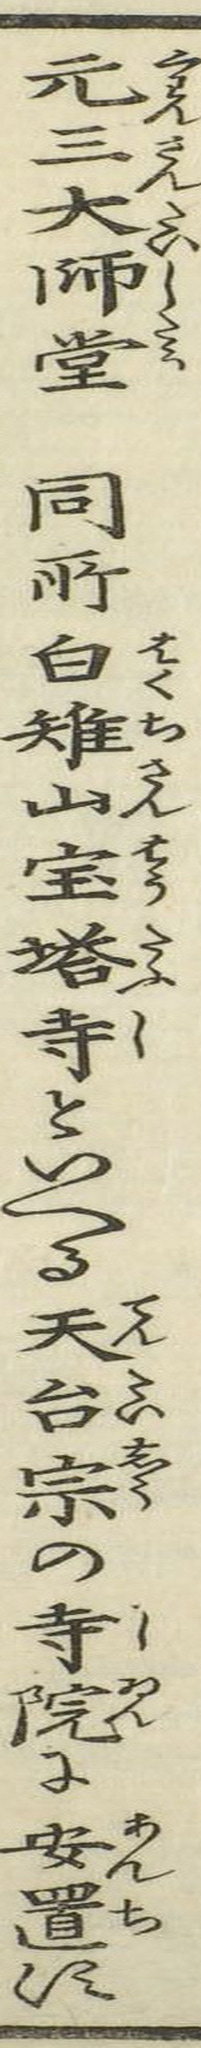元三大師堂同所白雉山宝塔寺といへる天台宗の寺院に安置す
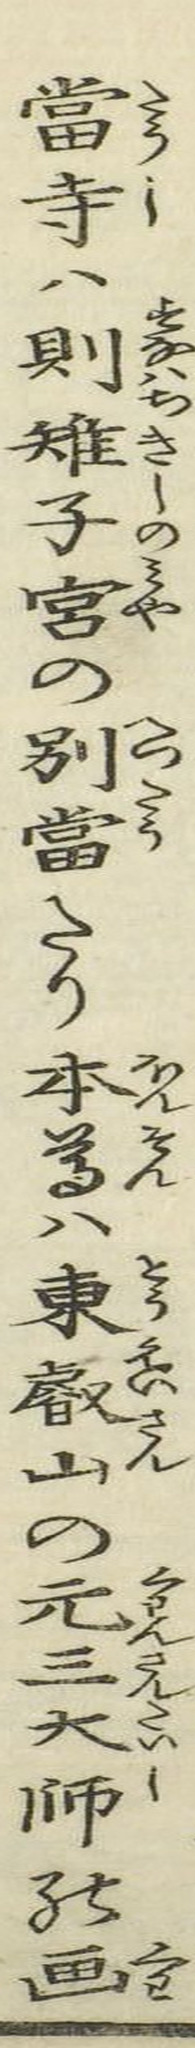當寺は則雉子宮の別當たり本尊は東叡山の元三大師の画
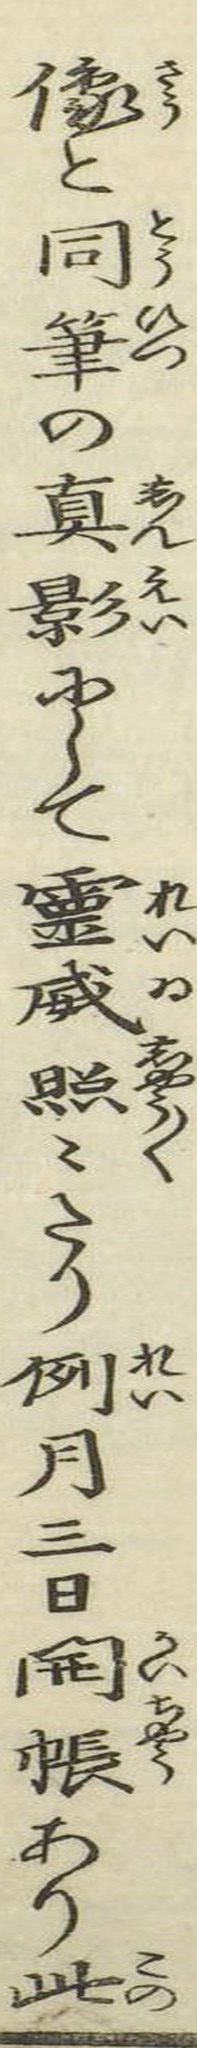像と同筆の真影にして靈威照々たり例月三日開帳あり此
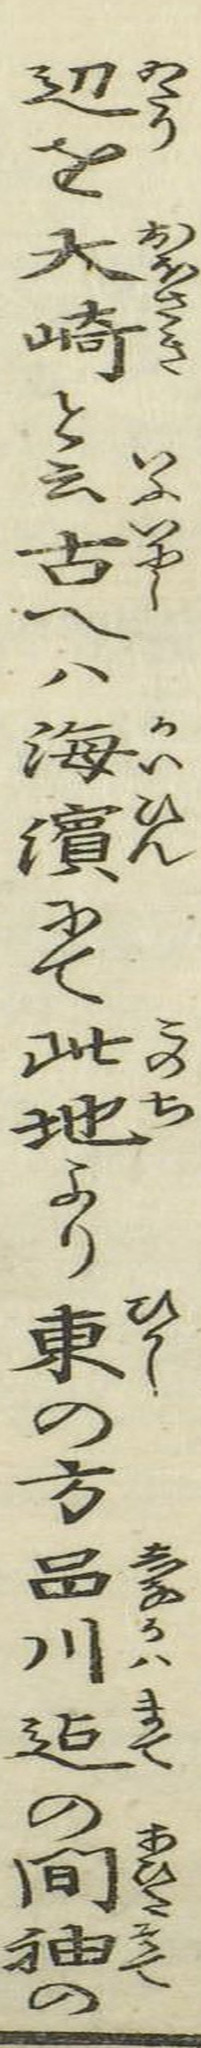辺を大崎と云古へは海濱にて此地より東の方品川迠の間袖の
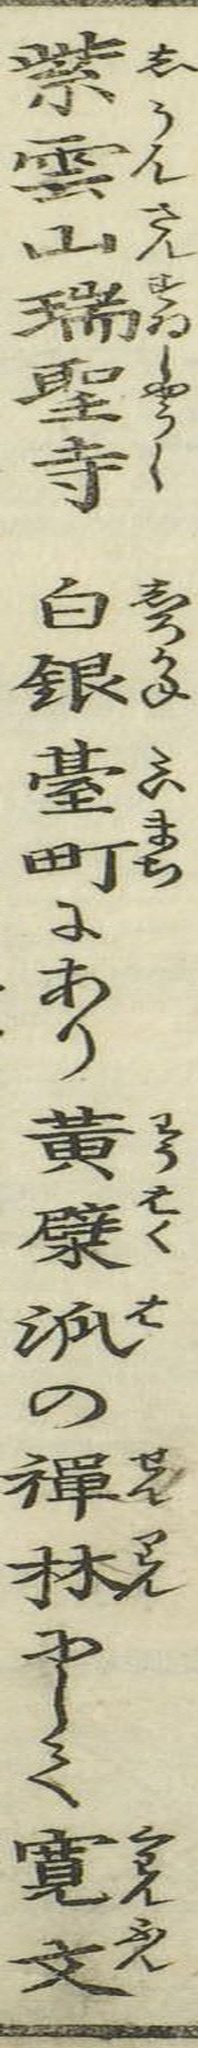紫雲山瑞聖寺白銀臺町にあり黄檗派の禪林にして寛文
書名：江戸名所図会 20巻 巻之7
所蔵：東京学芸大学教育コンテンツアーカイブ
